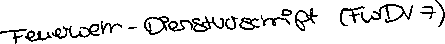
Feuerwehr-Dienstvorschrift (FwDV 7)
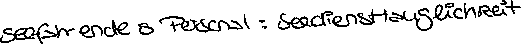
seefahrendes Personal: Seediensttauglichkeit
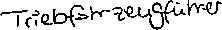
Triebfahrzeugführer
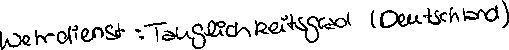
Wehrdienst: Tauglichkeitsgrad (Deutschland)
